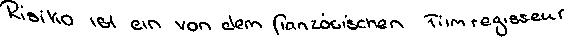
Risiko ist ein von dem französischen Filmregisseur
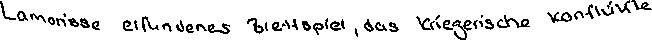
Lamorisse erfundenes Brettspiel, das kriegerische Konflikte
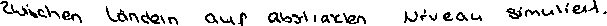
zwischen Ländern auf abstraktem Niveau simuliert.
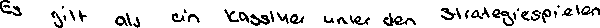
Es gilt als ein Klassiker unter den Strategiespielen
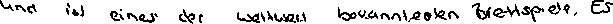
und ist eines der weltweit bekanntesten Brettspiele. Es
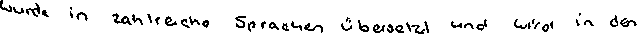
Es wurde in zahlreiche Sprachen übersetzt und wird in den
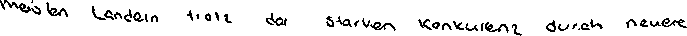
meisten Ländern trotz der starken Konkurrenz durch neuere
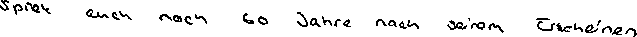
Spiele auch noch 60 Jahre nach seinem Erscheinen
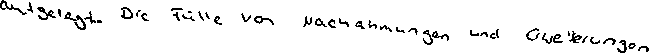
aufgelegt. Die Fülle von Nachahmungen und Erweiterungen
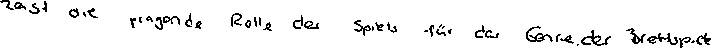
zeigt die prägende Rolle des Spiels für das Genre der Brettspiele.
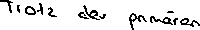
Trotz des primären
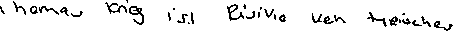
Themas Krieg ist Risiko kein typisches
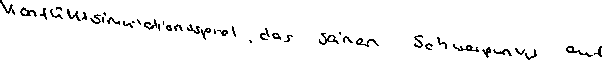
Konfliktsimulationsspiel, das seinen Schwerpunkt auf
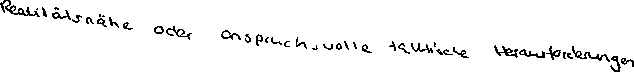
Realitätsnähe oder anspruchsvolle taktische Herausforderungen
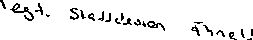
legt. Stattdessen ähnelt
